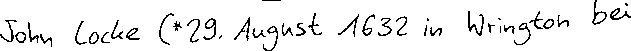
John Locke (* 29. August 1632 in Wrington bei
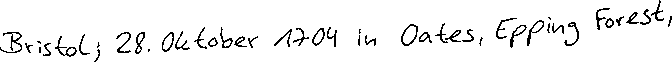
Bristol; 28. Oktober 1704 in Oates, Epping Forest,
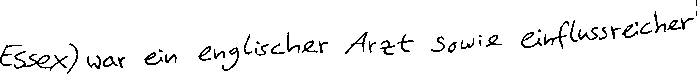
Essex) war ein englischer Arzt sowie einflussreicher
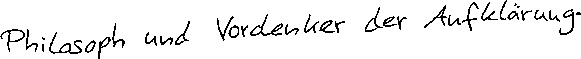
Philosoph und Vordenker der Aufklärung.
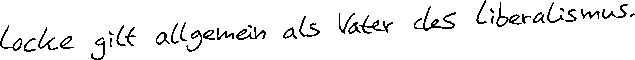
Locke gilt allgemein als Vater des Liberalismus.
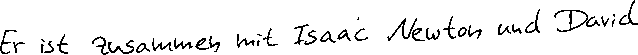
Er ist zusammen mit Isaac Newton und David
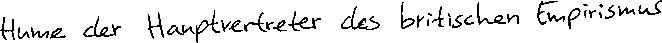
Hume der Hauptvertreter des britischen Empirismus
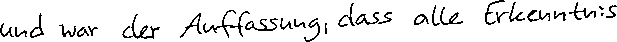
und war der Auffassung, dass alle Erkenntnis
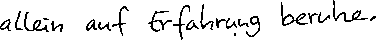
allein auf Erfahrung beruhe.
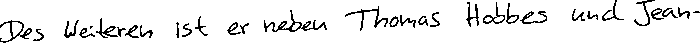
Des Weiteren ist er neben Thomas Hobbes und Jean-
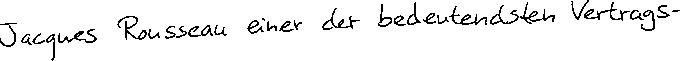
Jacques Rousseau einer der bedeutendsten Vertrags-
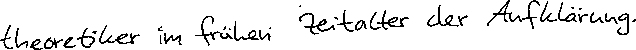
theoretiker im frühen Zeitalter der Aufklärung.
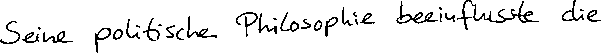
Seine politische Philosophie beeinflusste die
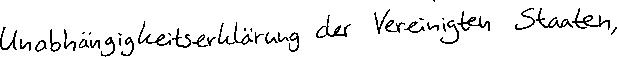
Unabhängigkeitserklärung der Vereinigten Staaten,
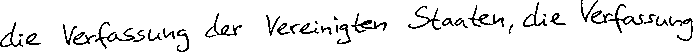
die Verfassung der Vereinigten Staaten, die Verfassung
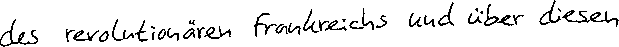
des revolutionären Frankreichs und über diesen
